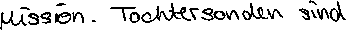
Mission. Tochtersonden sind
